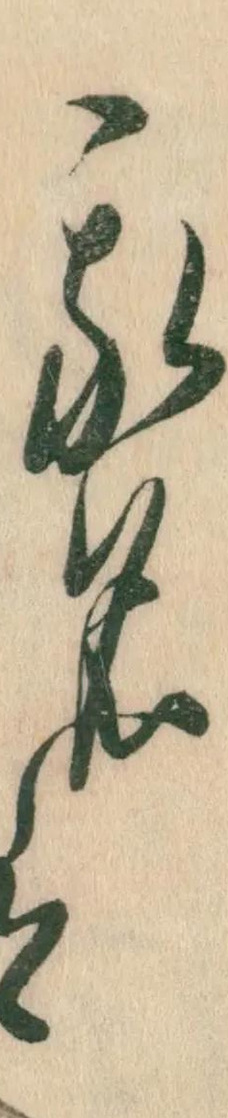我名は
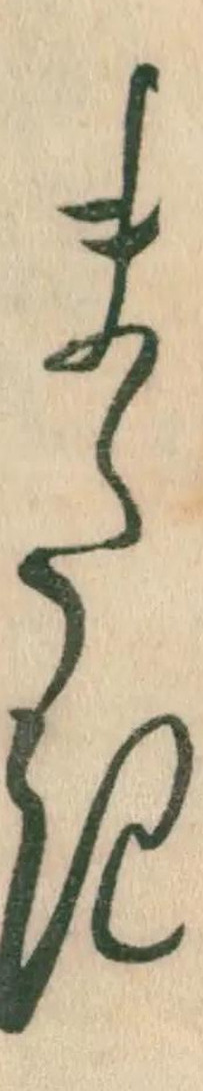またき
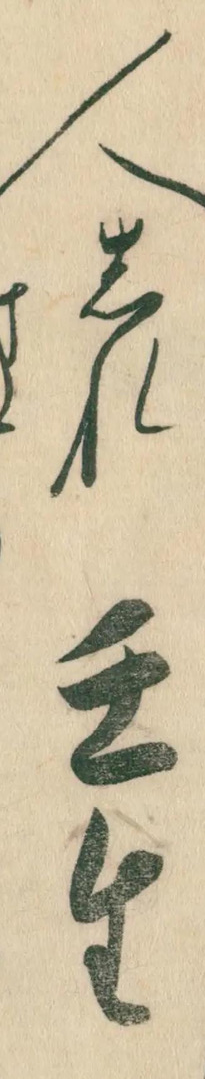人しれ壬生

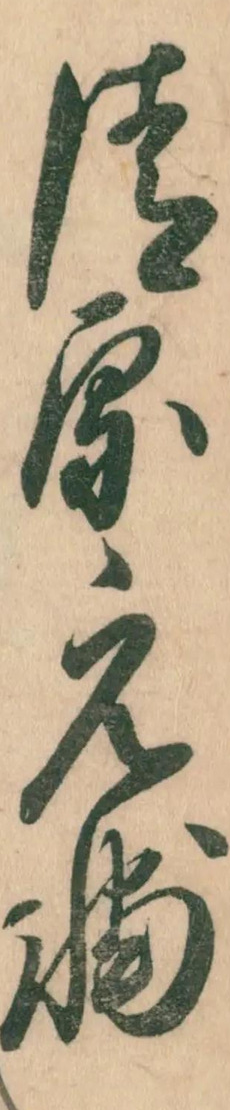清原元輔
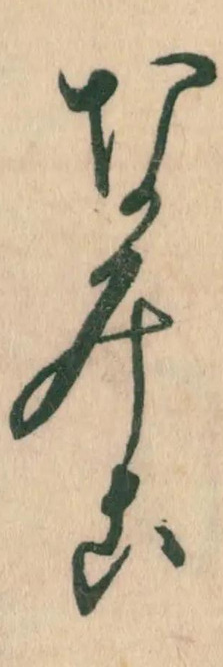なみこ
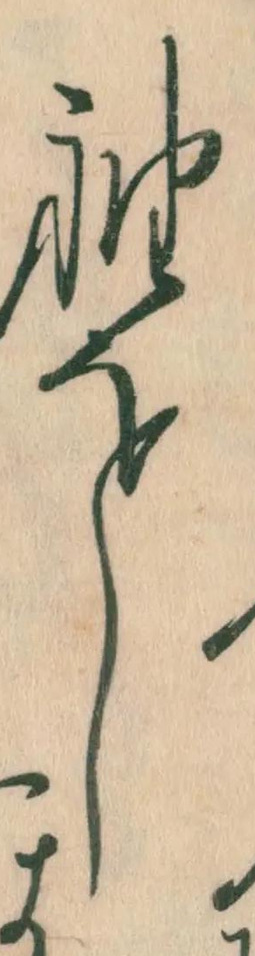袖をし
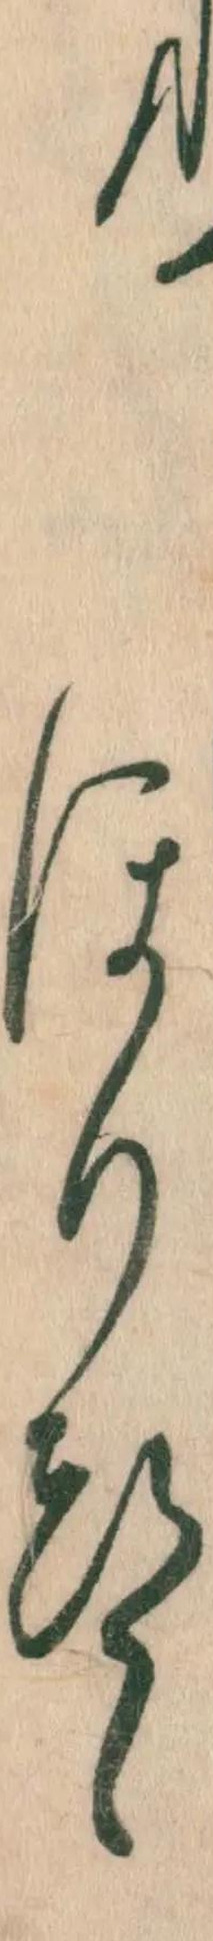ほりつゝ
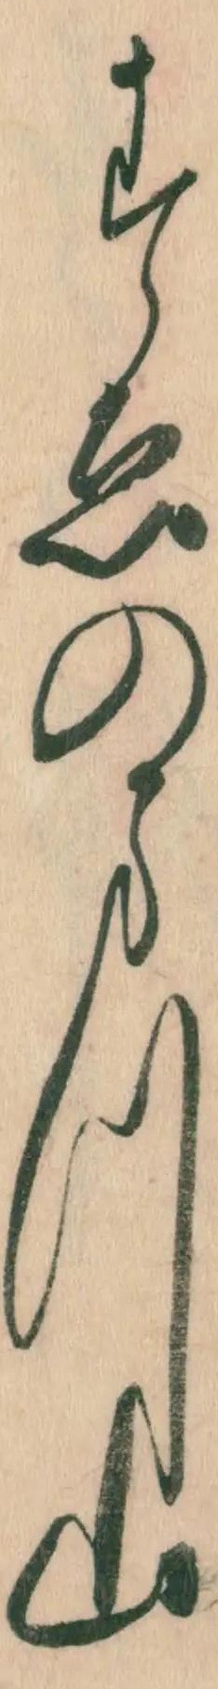すゑのまつ山
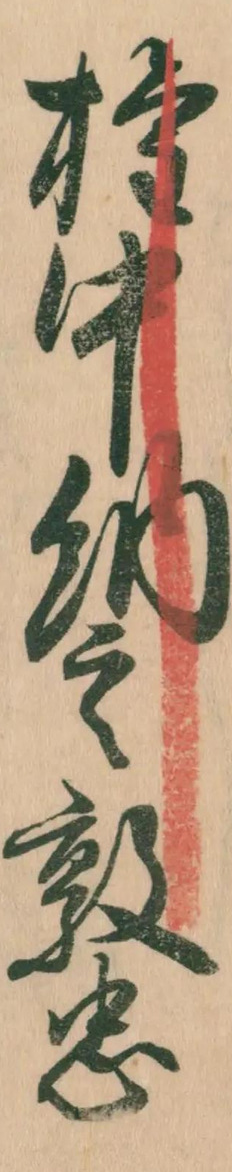權中納言淳忠
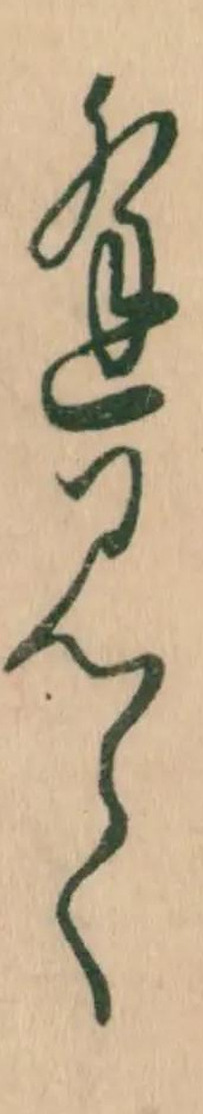逢見て
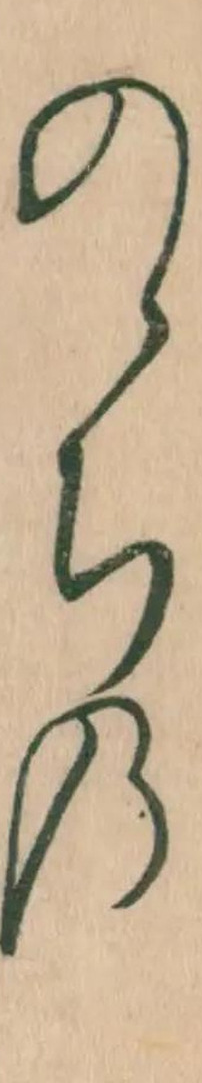のゝちの
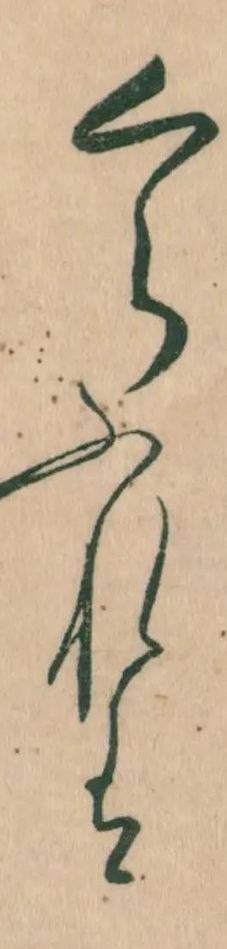くらふれは
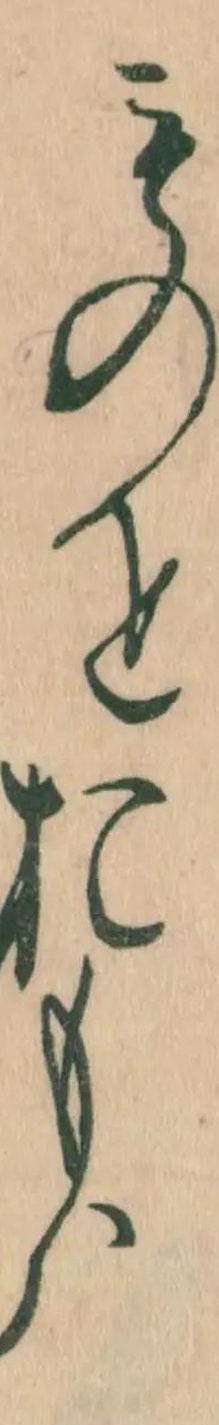ものをおもは
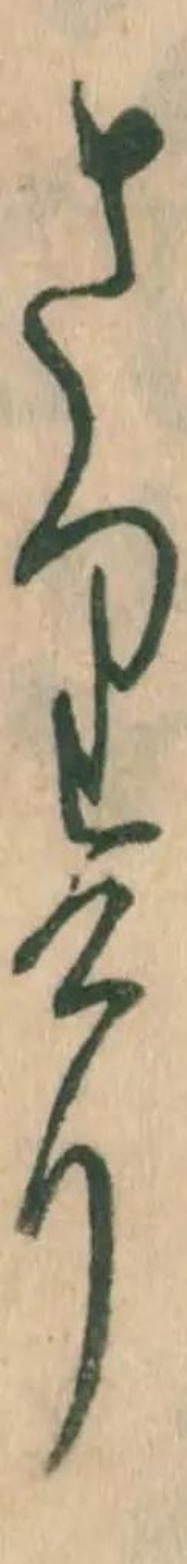さりけり

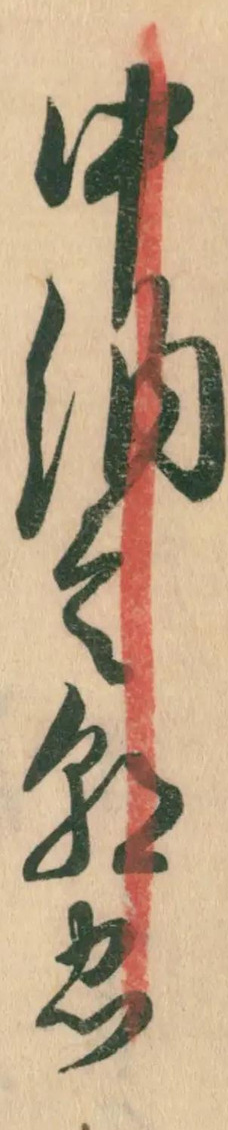中納言朝忠
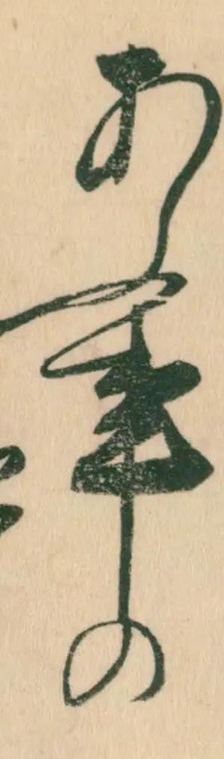あふ事の
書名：錦百人一首あつま織
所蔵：国立国会図書館 National Diet Library, JAPAN
